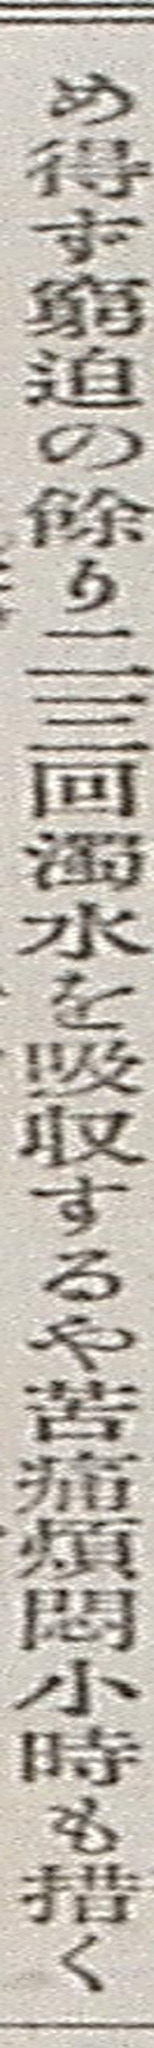め得ず窮迫の余り二三回濁水を吸収するや苦痛煩悶小時も措く
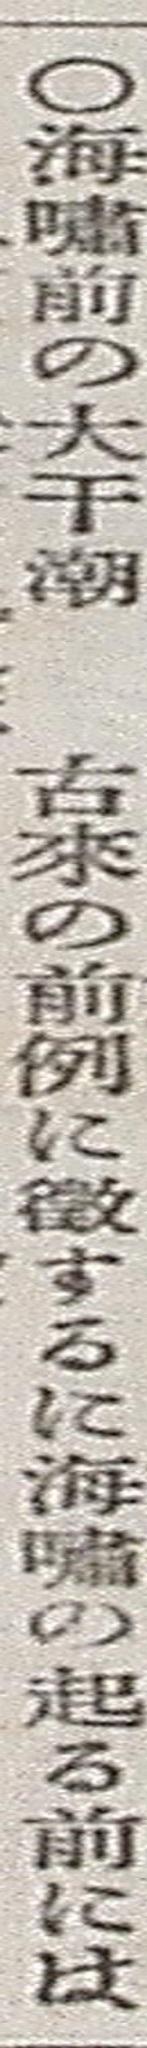○海嘯前の大干潮古来の前例に徴するに海嘯の起る前には
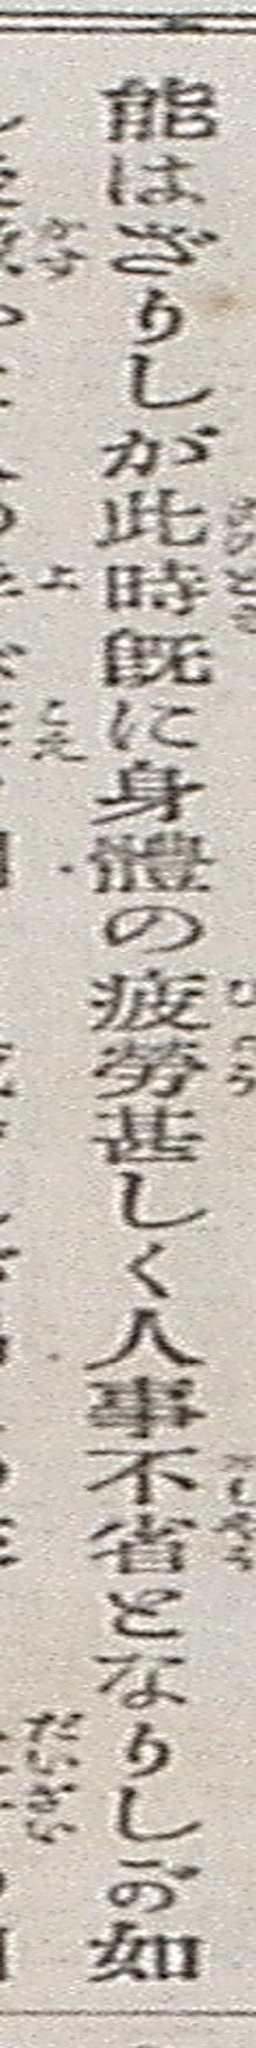能はざりしが此時既に身体の疲労甚しく人事不省となりしが如
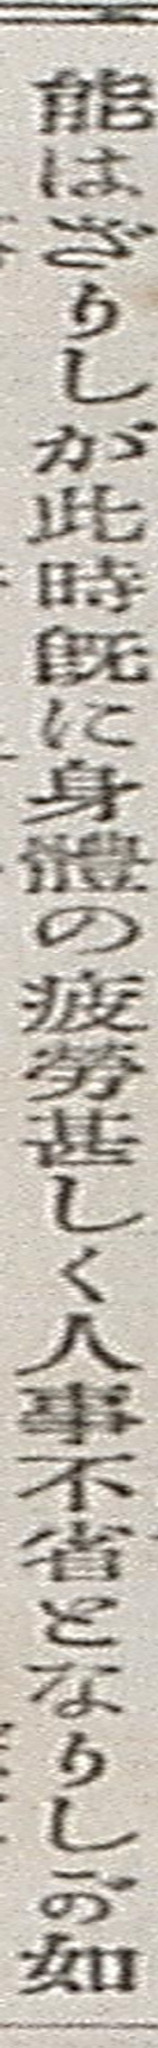能はざりしが此時既に身体の疲労甚しく人事不省となりしが如
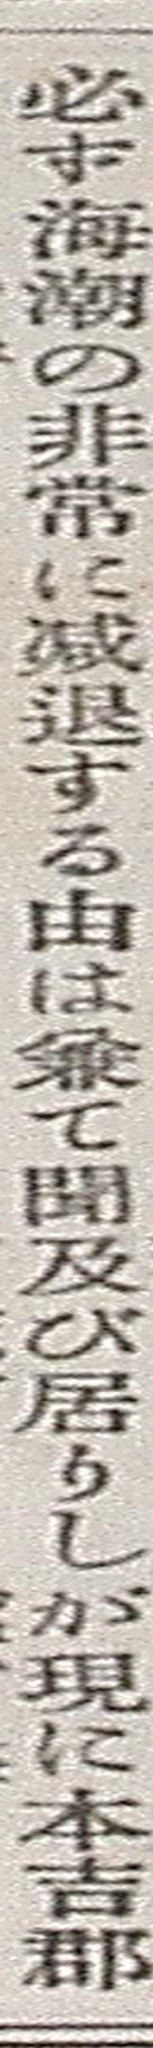必ず海潮の非常に減退する由は兼て聞及び居りしが現に本吉郡
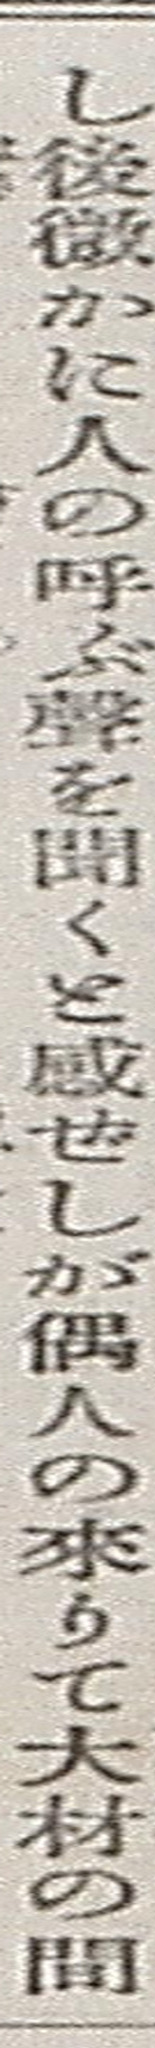し後微かに人の呼ぶ声を聞くと感ぜしが偶人の来りて大材の間
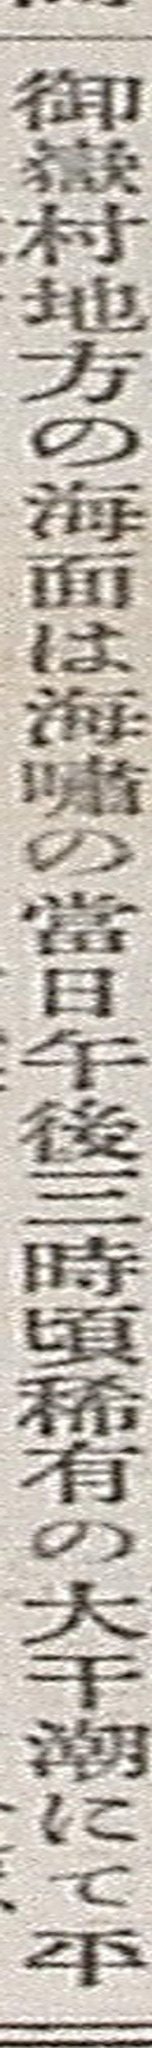御嶽村地方の海面は海嘯の当日午後三時頃稀有の大干潮にて平
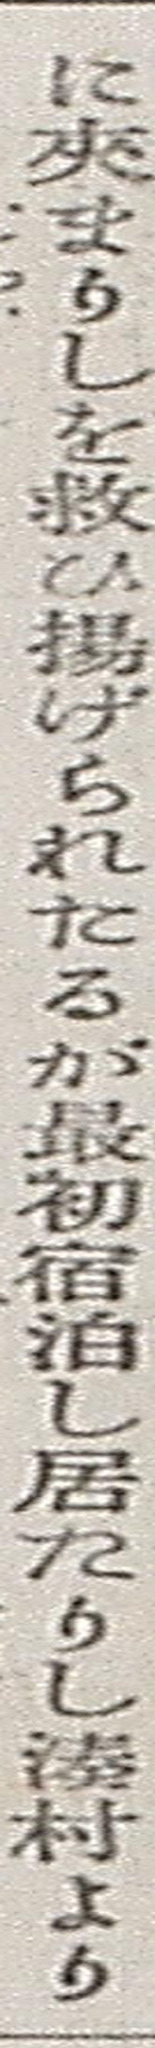に夾まりしを救ひ揚げられたるが最初宿泊し居たりし湊村より
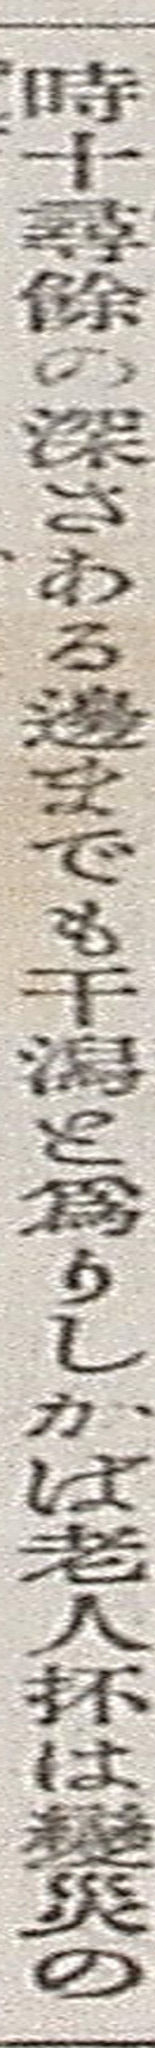時十尋余の深さある辺までも干潟と為ししかば老人抔は変災の
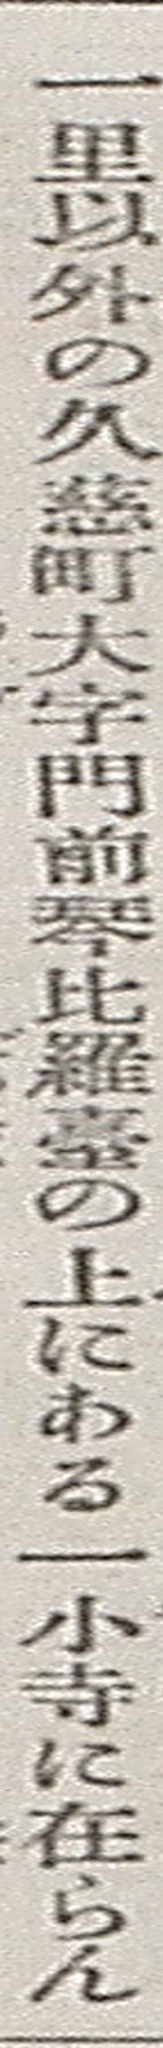一里以外の久慈町大字門前琴比羅台の上にある一小寺に在らん
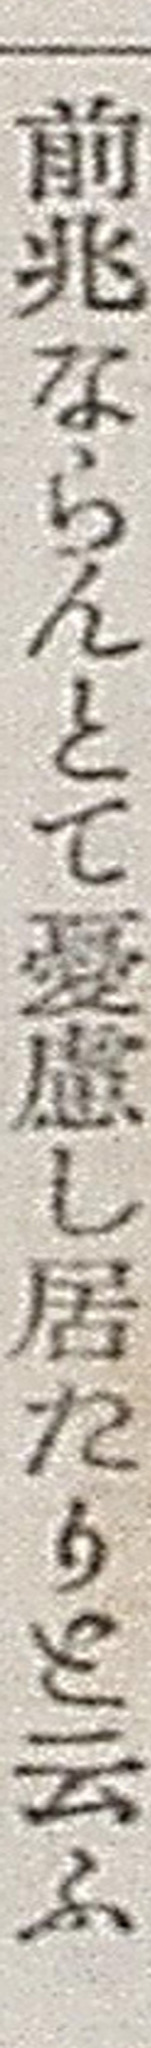前兆ならんとて憂慮し居たりと云ふ
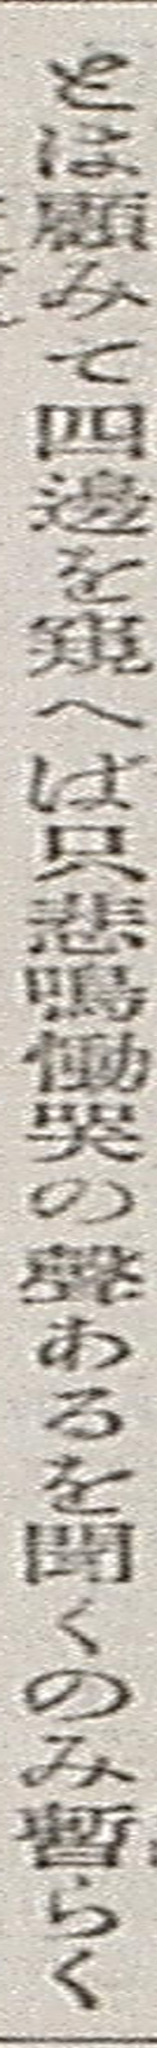とは顧みて四辺を窺へば只悲鳴慟哭の声あるを聞くのみ暫らく
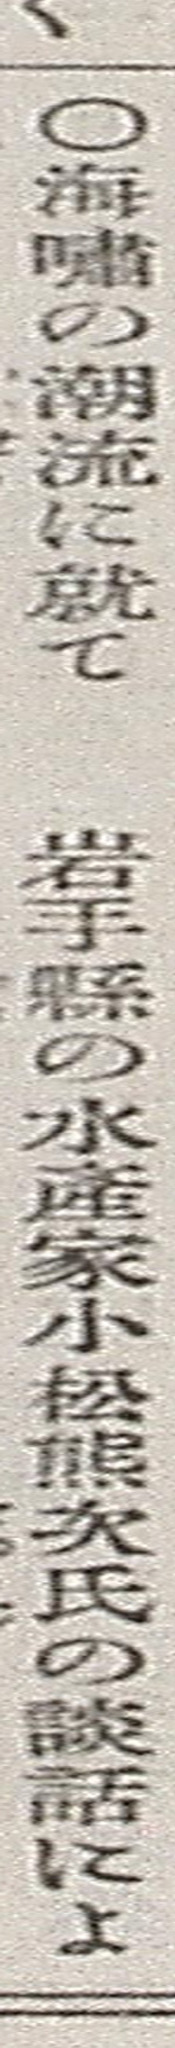○海嘯の潮流に就て岩手県の水産家小松熊次氏の談話によ
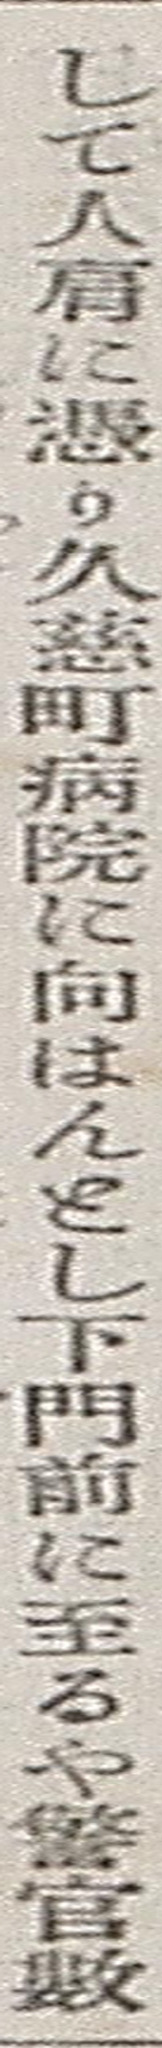して人肩に憑り久慈町病院に向はんとし下門前に至るや警官数
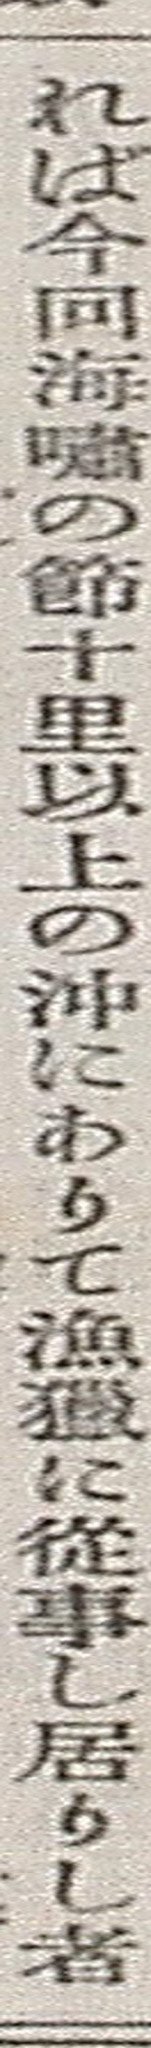れば今回海嘯の節十里以上の沖にありて漁猟に従事し居りし者
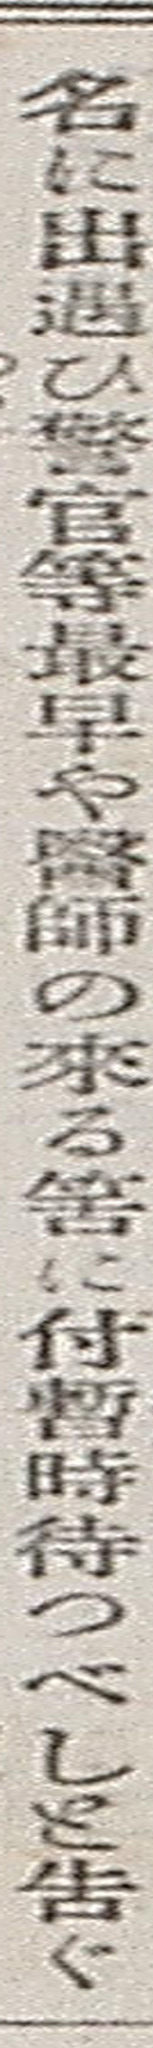名に出遇ひ警官等最早や医師の来る筈に付暫時待べしと告ぐ
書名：風俗畫報臨時増刊第百二十號　大海嘯被害録（下）
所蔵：東京大学地震研究所図書室 Earthquake Research Institute Library, The University of Tokyo, JAPAN
